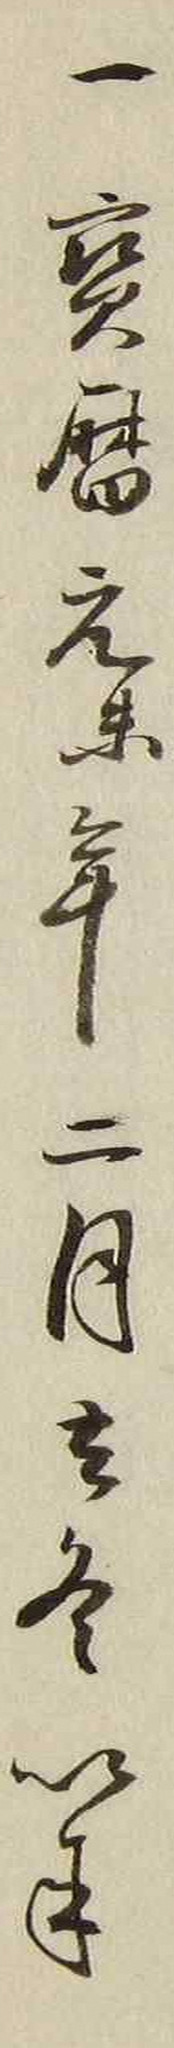一宝暦元未年二月去冬以来
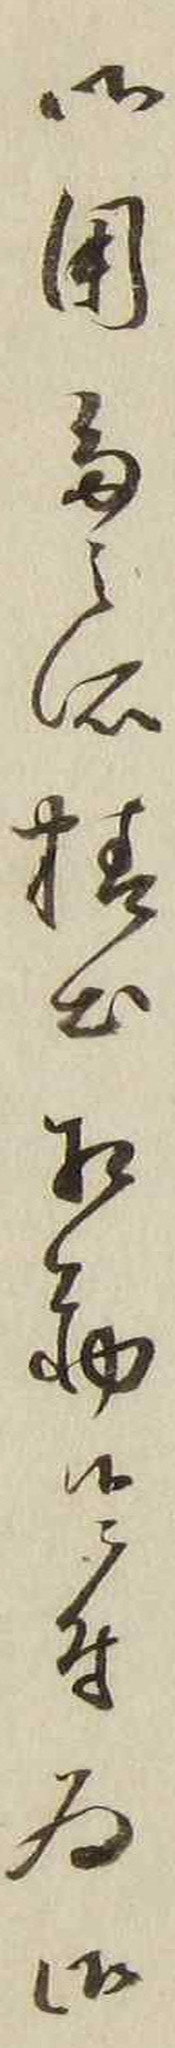御用多之所精出相勤候ニ付為御

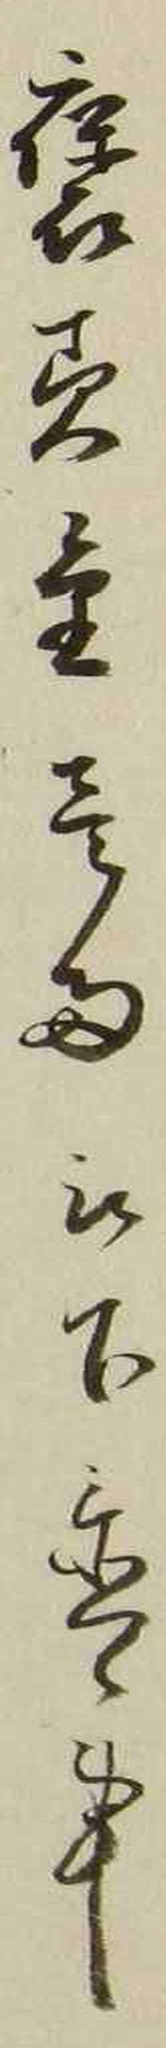褒美金壱両被下置候事
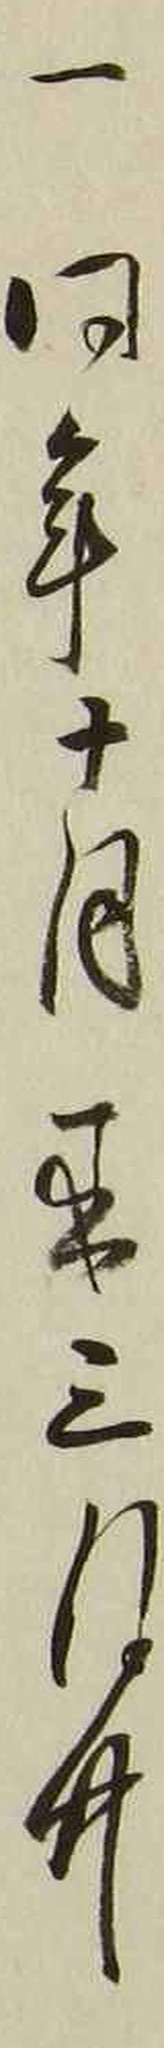一同年十月来三月中
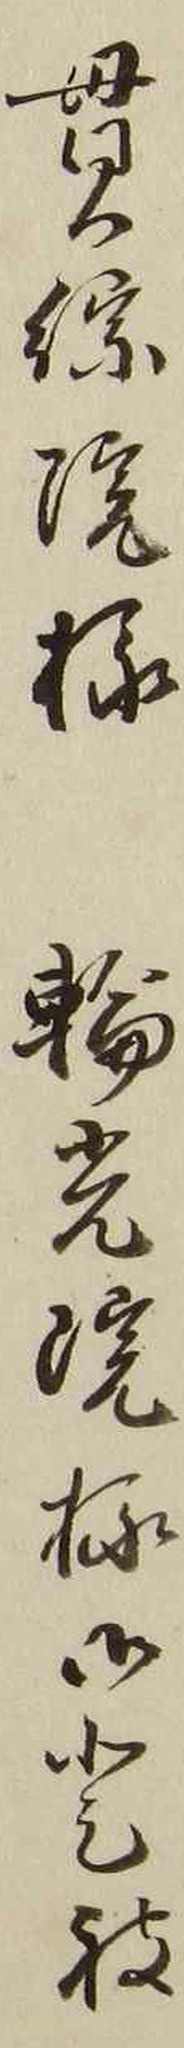貫綜院様輪光院様御登被
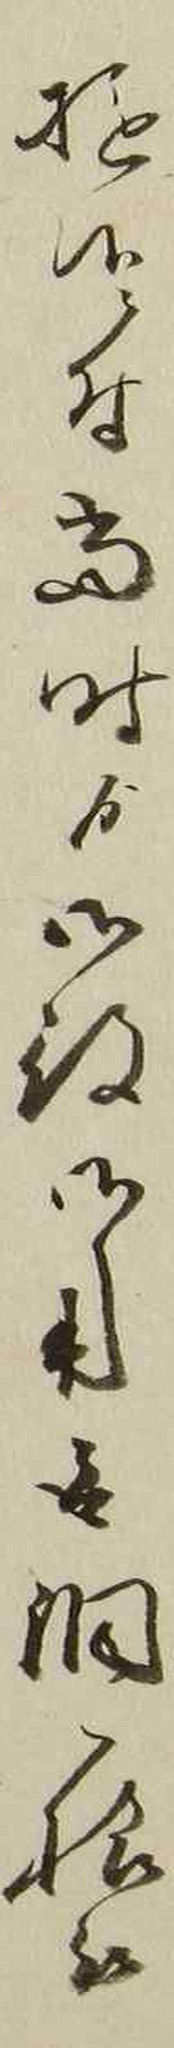遊候ニ付当時ゟ御役御用取調候様被
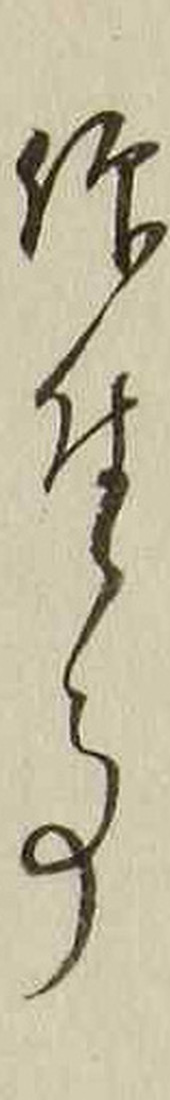仰付候事
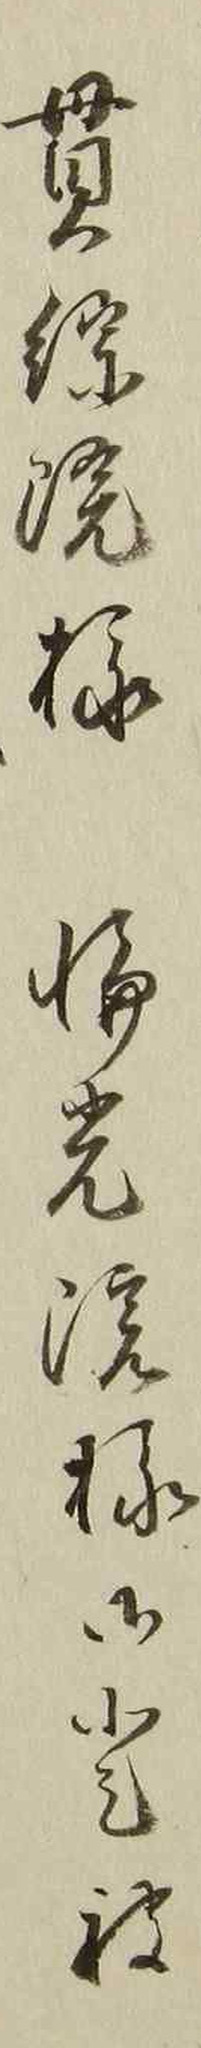貫綜院様輪光院様御登被
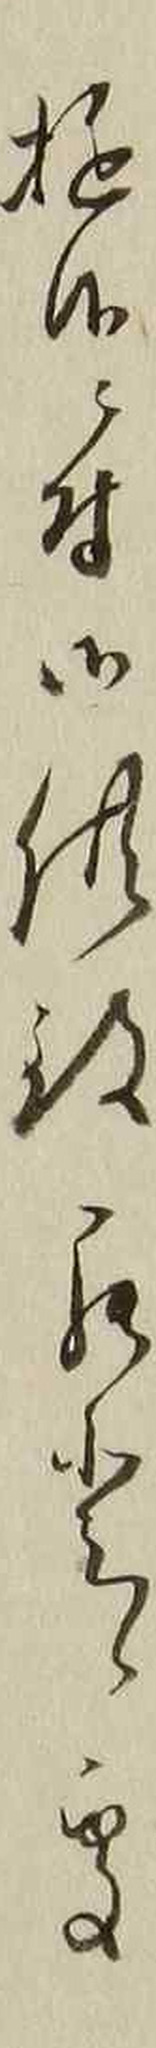遊候ニ付御供致罷登候処
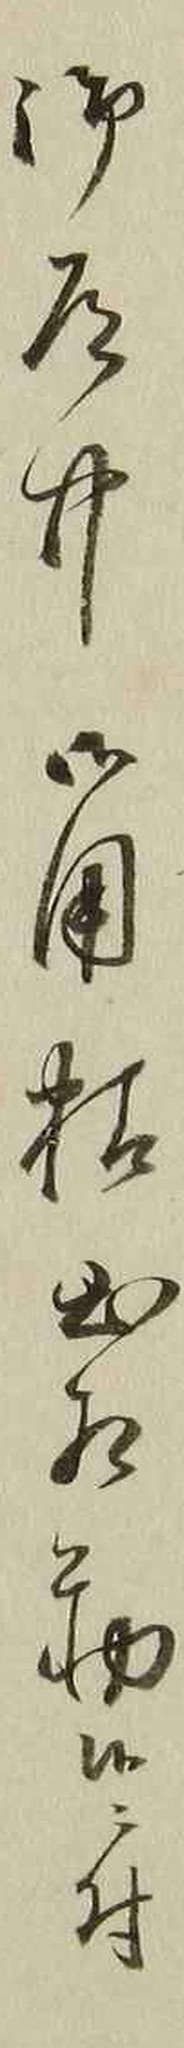御道中御用精出相勤候ニ付
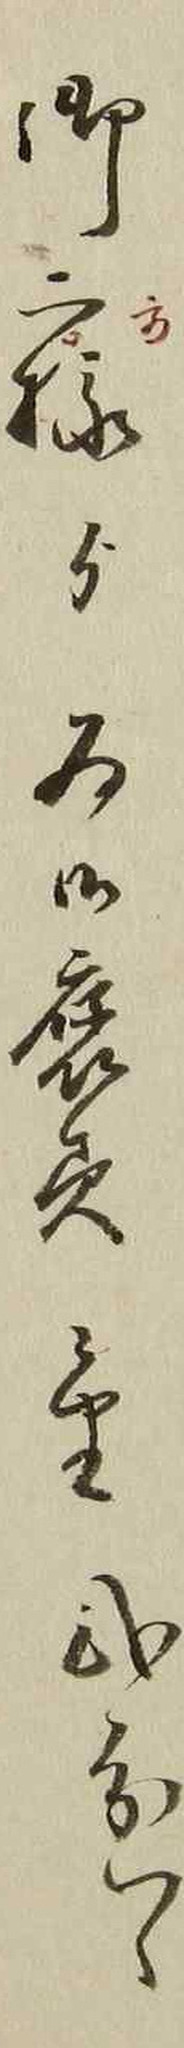御二方様ゟ為御褒美金弐分ツヽ
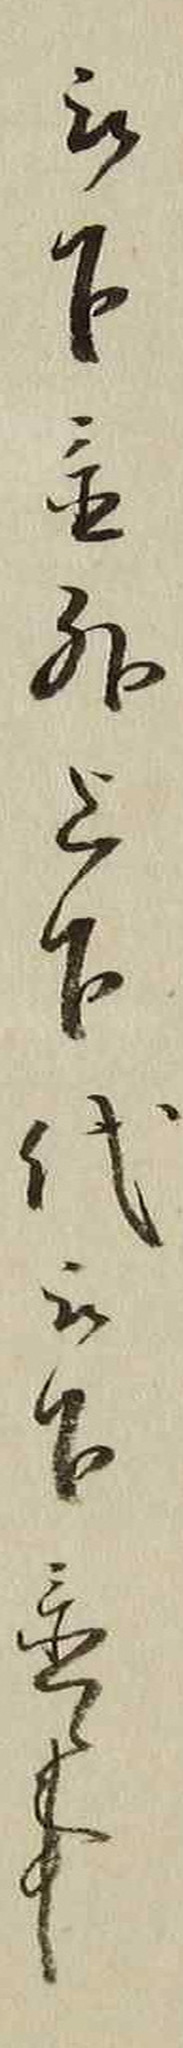被下置外上下代被下置候事
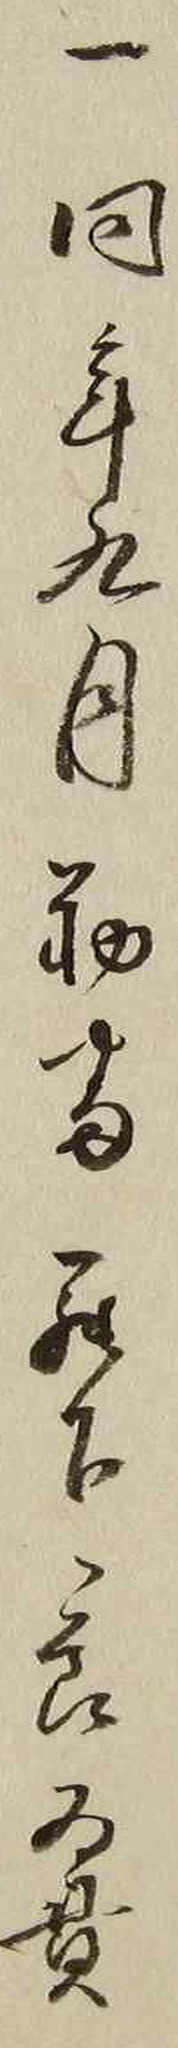一同年九月勤番罷下候節為貫
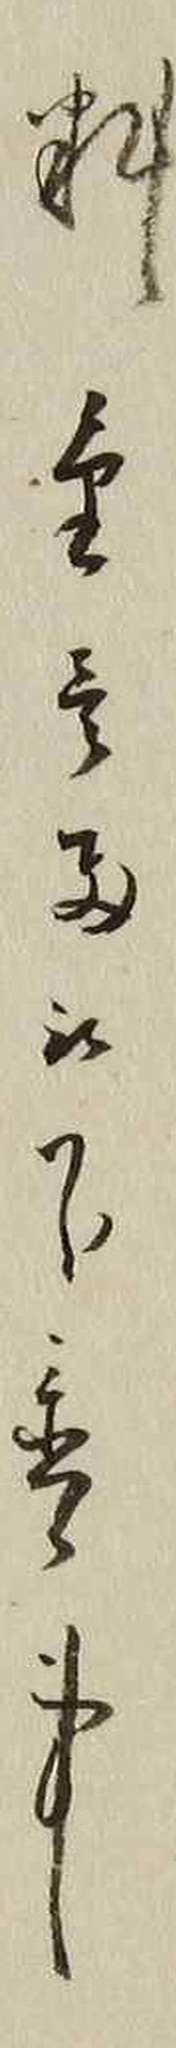料金壱両被下置候事
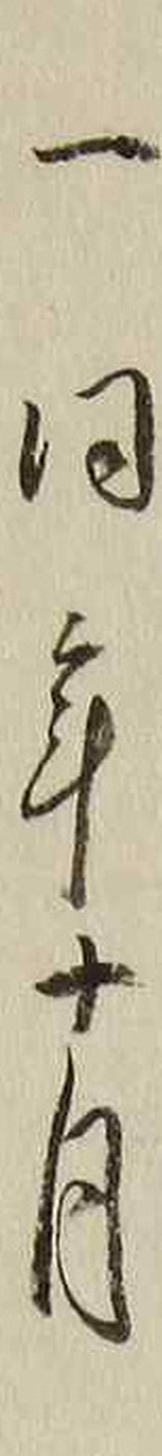一同年十月
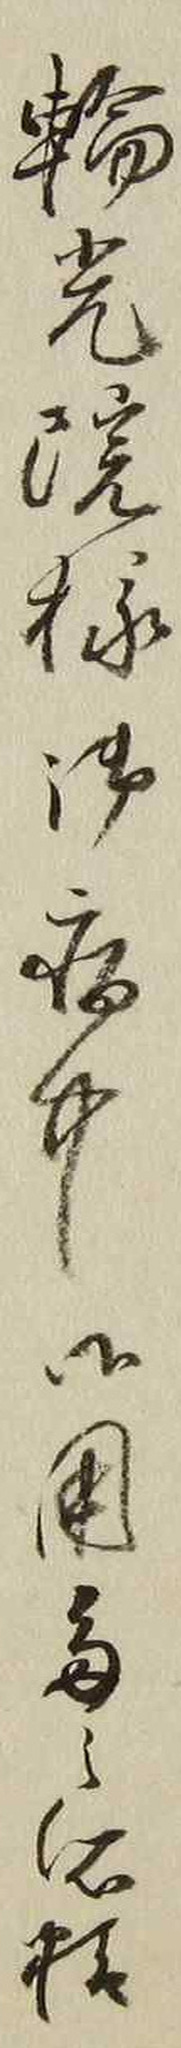輪光院様御病中御用多之所精
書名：諸士系譜　巻之52　に之部3
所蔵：会津若松市立会津図書館
